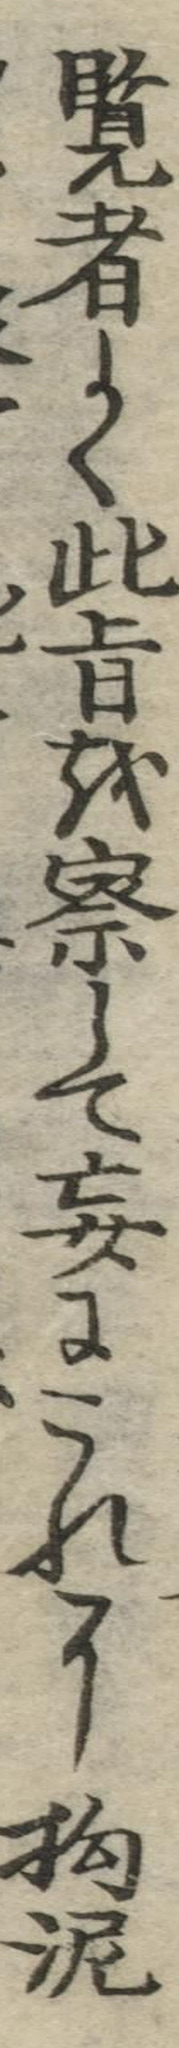覧者よく此旨を察して妄にこれに拘泥
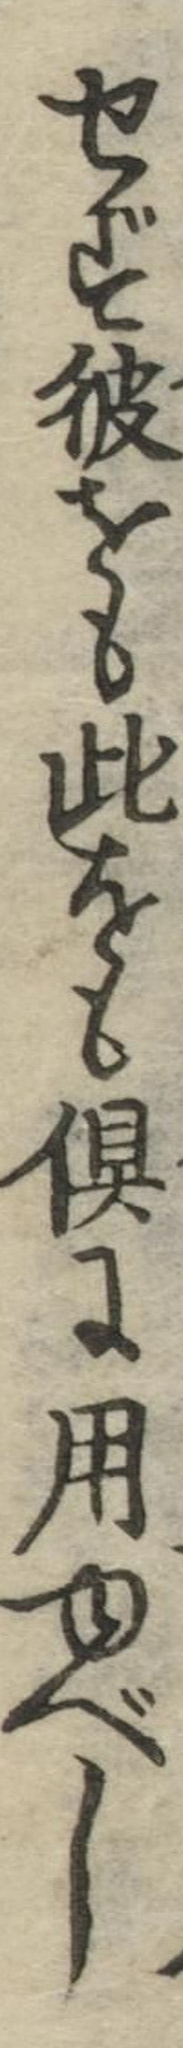せず彼をも此をも倶に用ゆべし
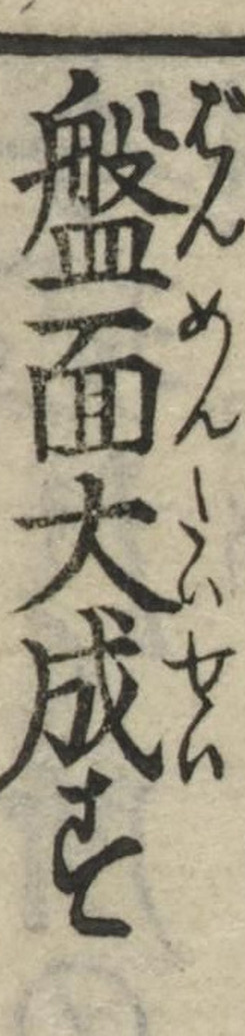盤面大成す

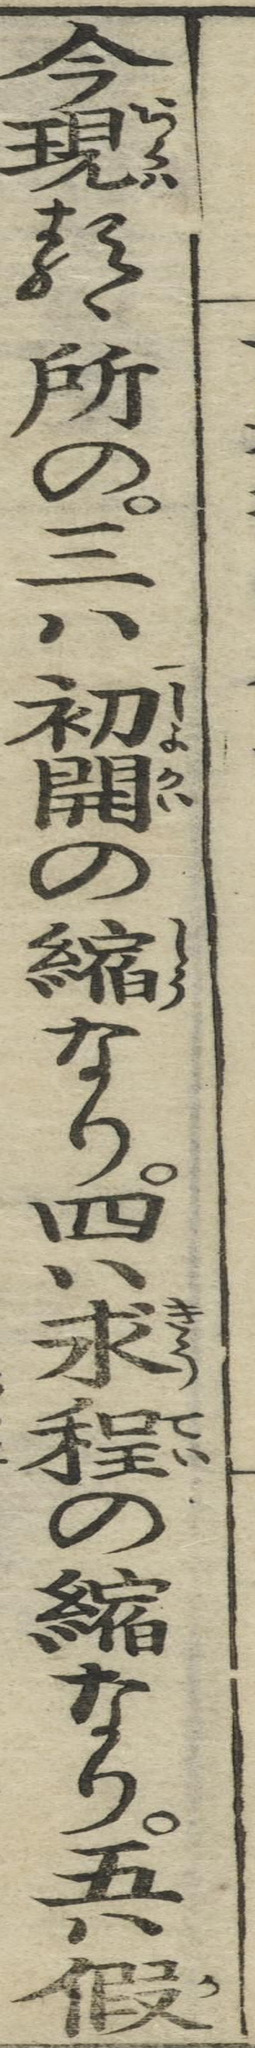今現るゝ所の。三は初開の縮なり。四は求程の縮なり。五は仮
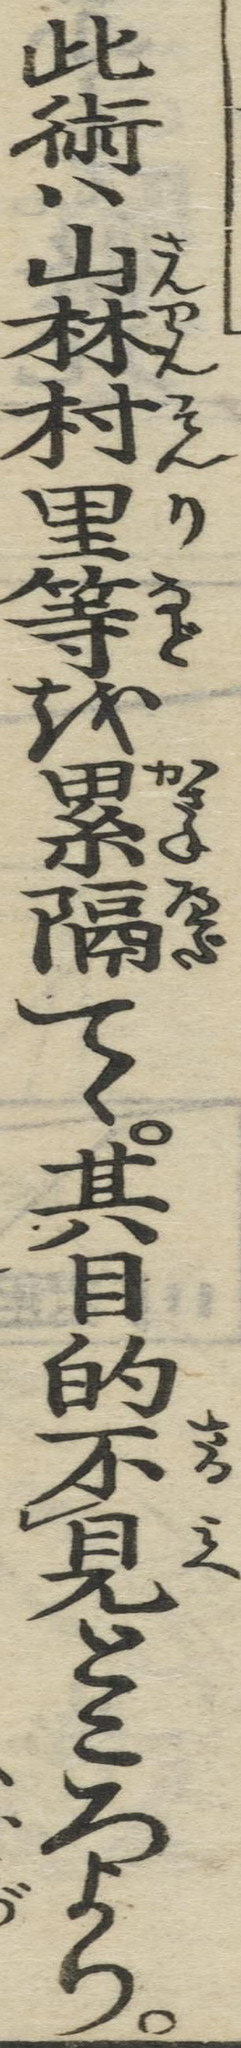此術は山林村里等を累隔てゝ。其目的不見ところより。
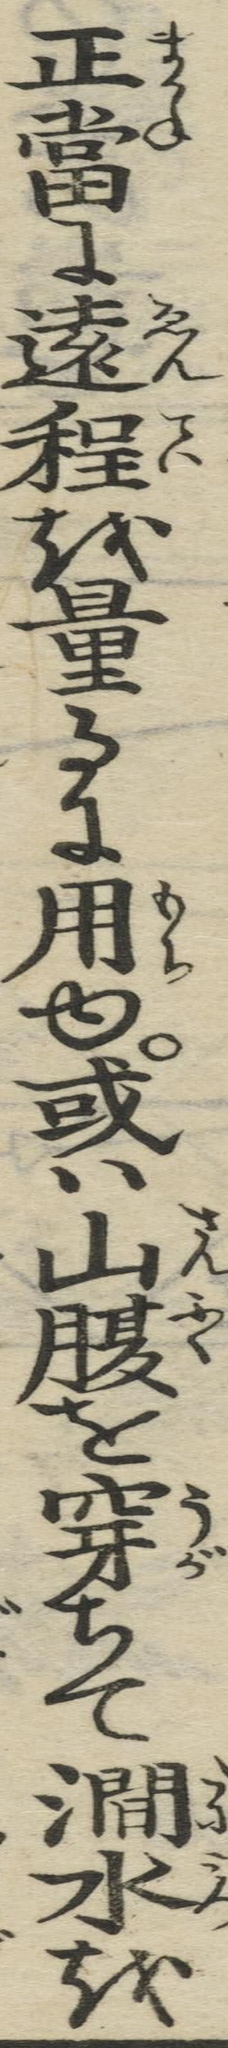正当に遠程を量るに用ゆ。或は山腹を穿ちて澗水を
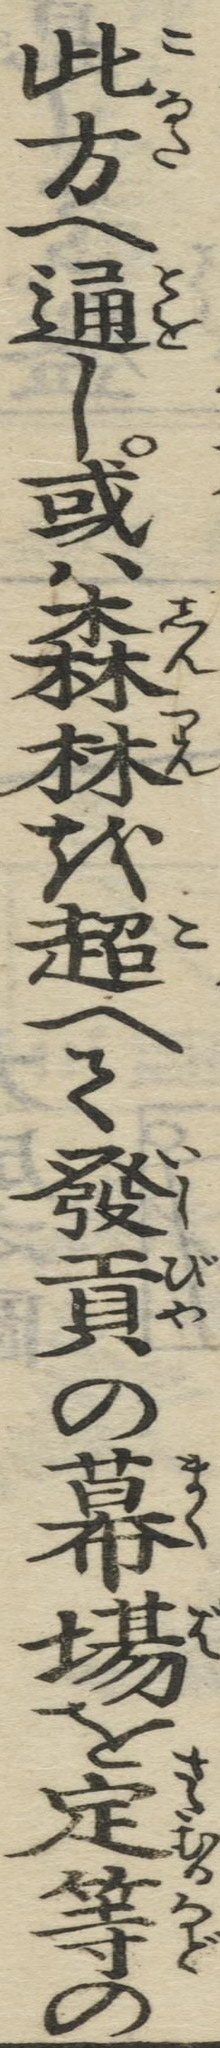此方へ通し。或は森林を超へて発貢の幕場を定等の
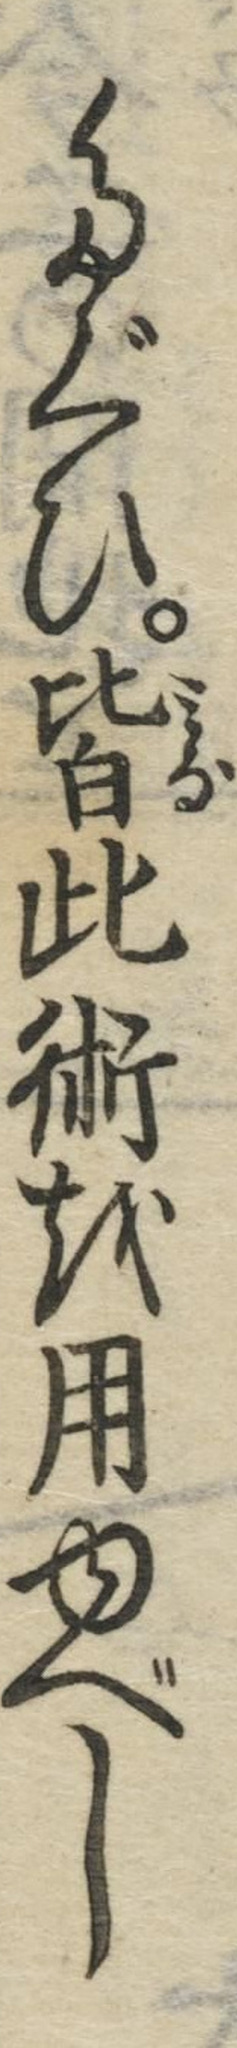たぐひ。皆此術を用ゆべし
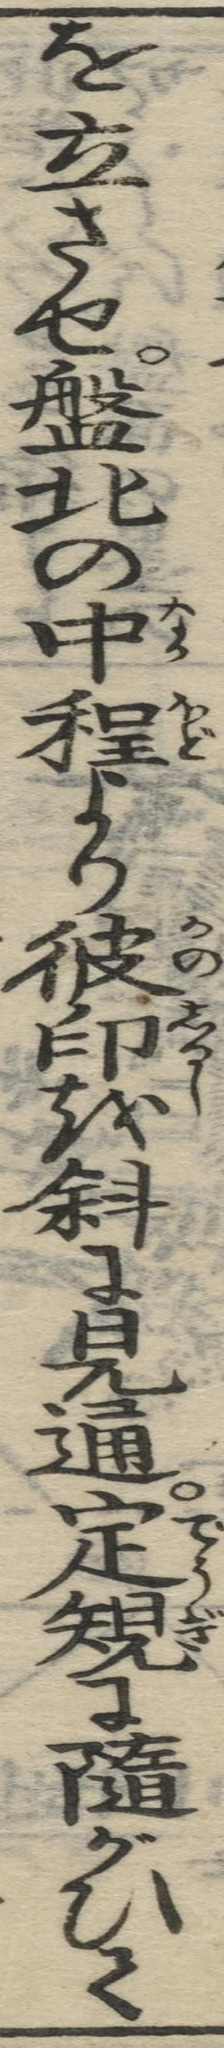を立させ。盤北の中程より彼印を斜に見通。定規に随がひて
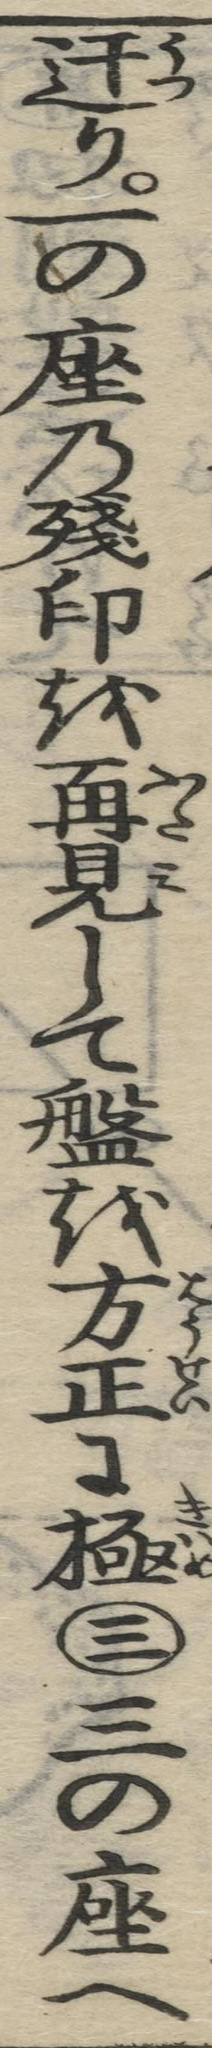迂り。一の座の残印を再見して盤を方正に極㊂三の座へ
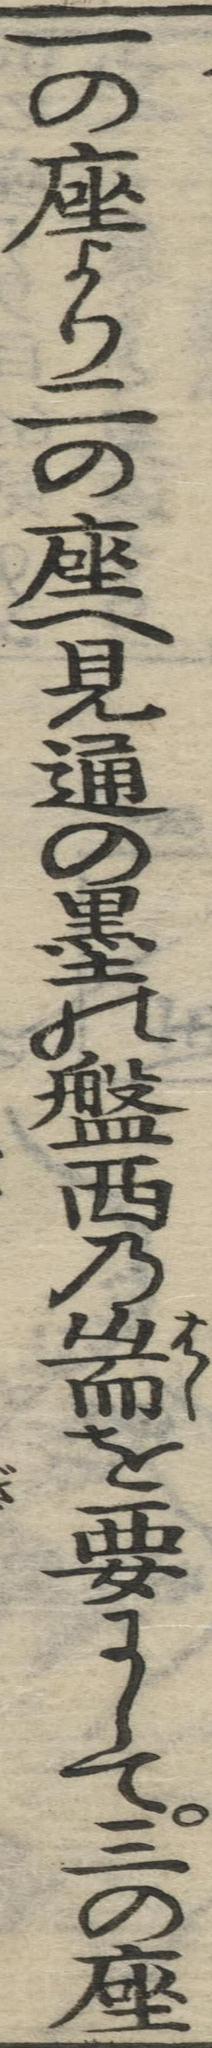一の座より二の座へ見通の墨の盤西の端を要にして。三の座
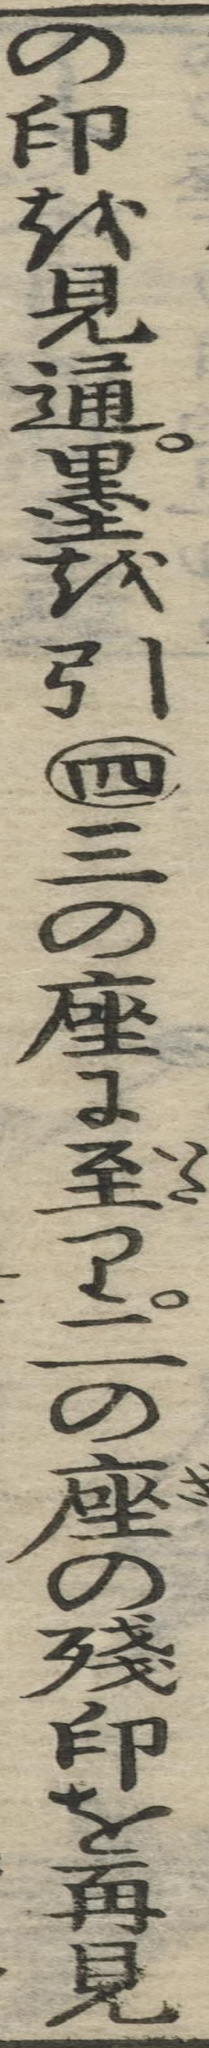の印を見通。墨を引㊃三の座に至り。二の座の残印を再見
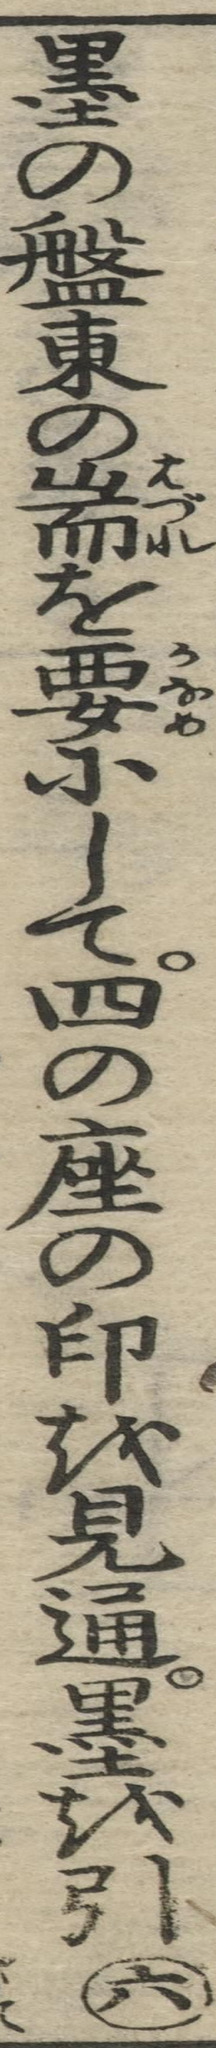墨の盤東の端を要にして。四の座の印を見通。墨を引㊅
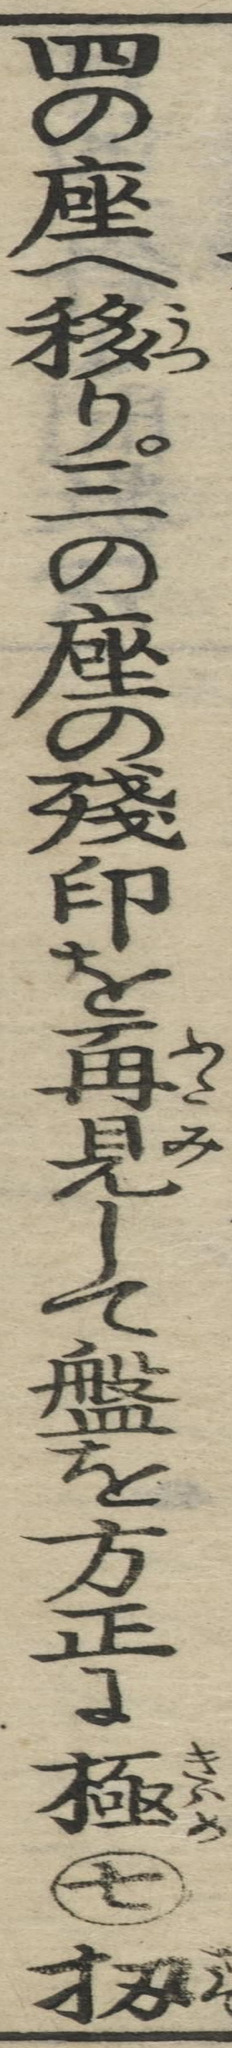四の座へ移り。三の座の残印を再見して盤を方正に極㊆扨

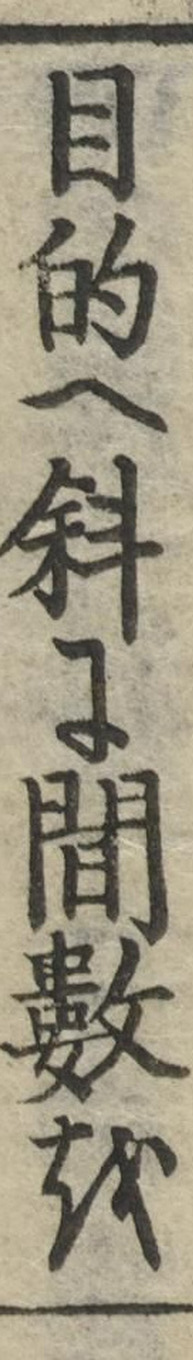目的へ斜に間数を
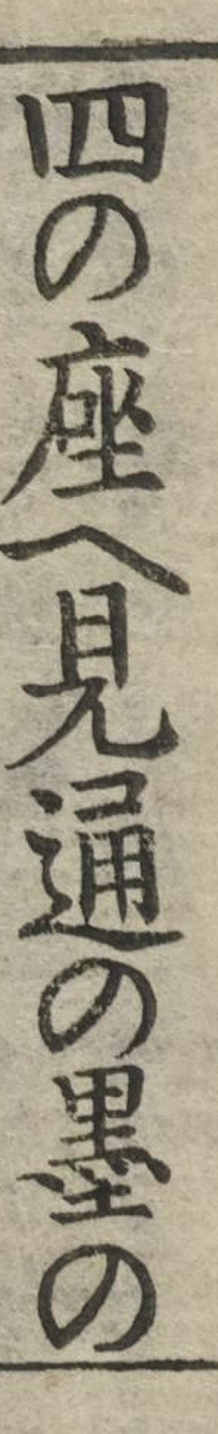四の座へ見通の墨の
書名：量地指南　巻之二（内題）
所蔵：東京大学地震研究所図書室 Earthquake Research Institute Library, The University of Tokyo, JAPAN
